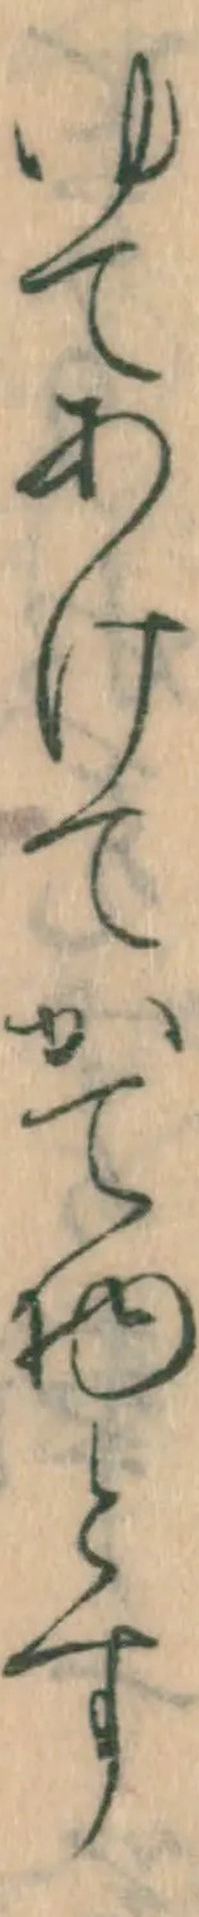ゆてあけてかて物とす
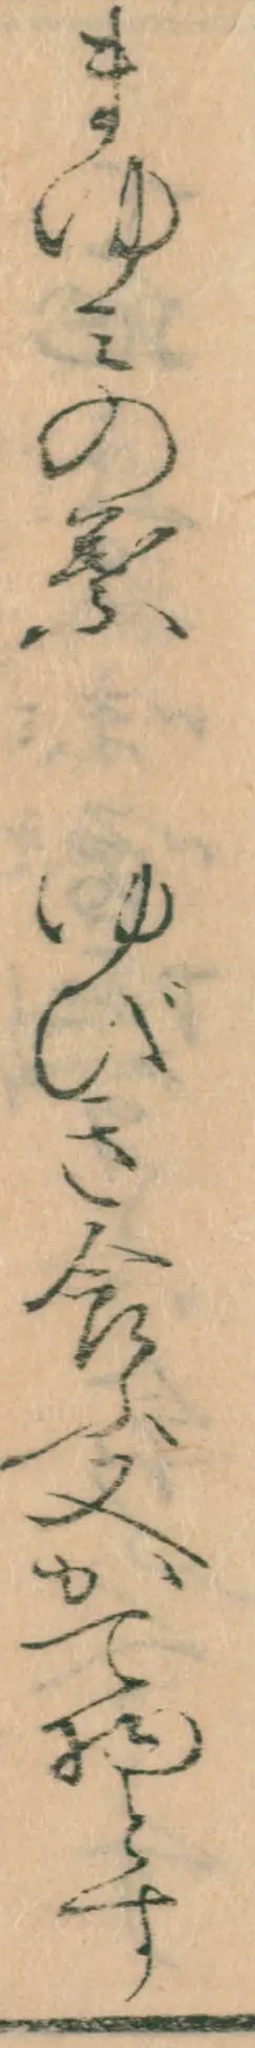まゆみの葉ゆびき食ふ又かて物とす
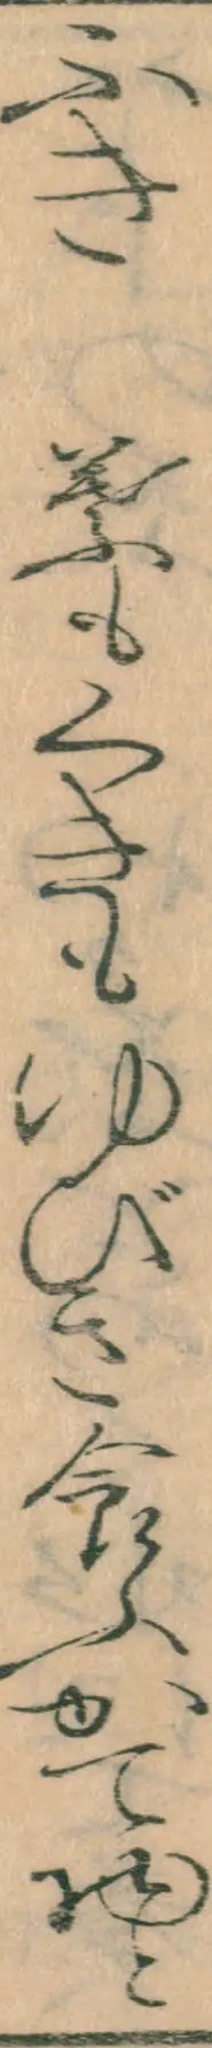ふき葉もくきもゆびき食ふかて物と
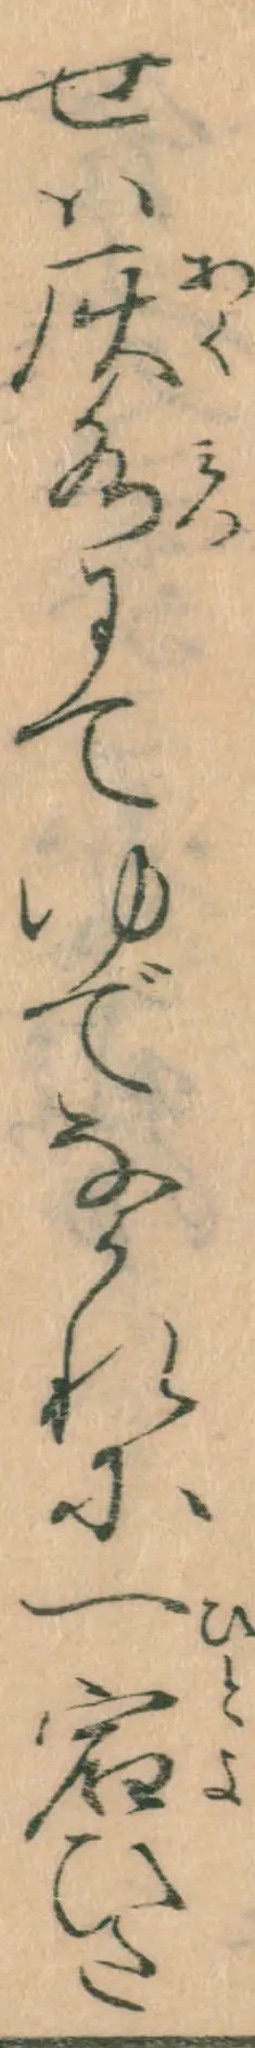せは灰水にてゆでなかれに一宿ひた
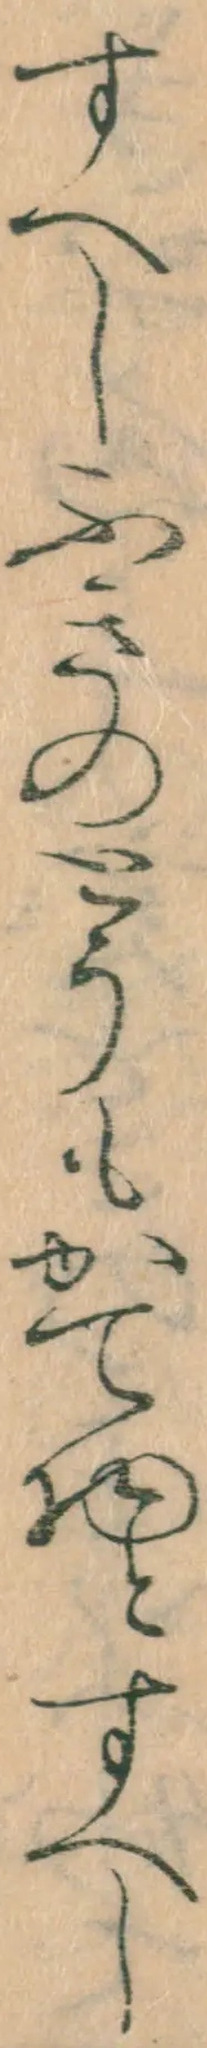すへしふきのとうもかて物とすへし
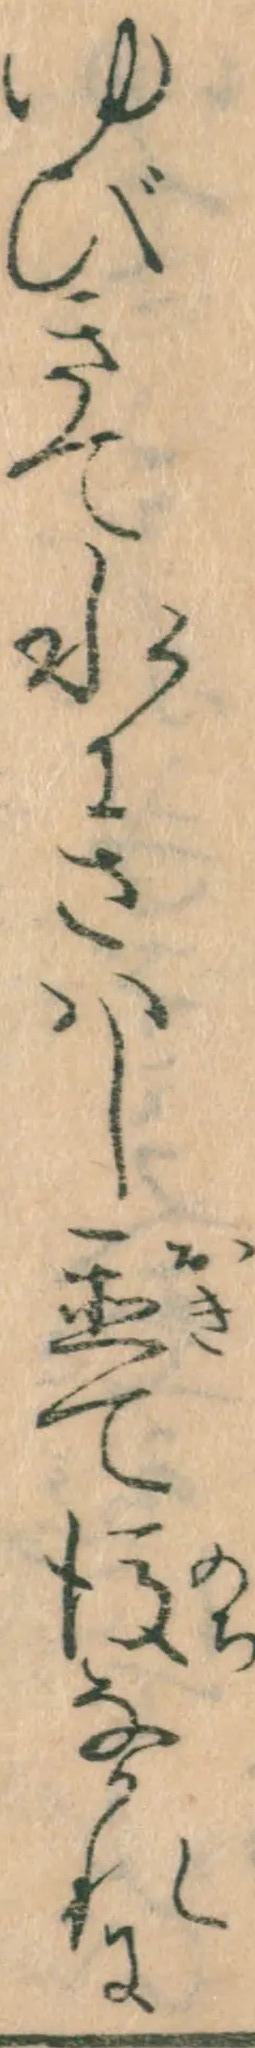ゆびきて水にさはし置て後なかれに
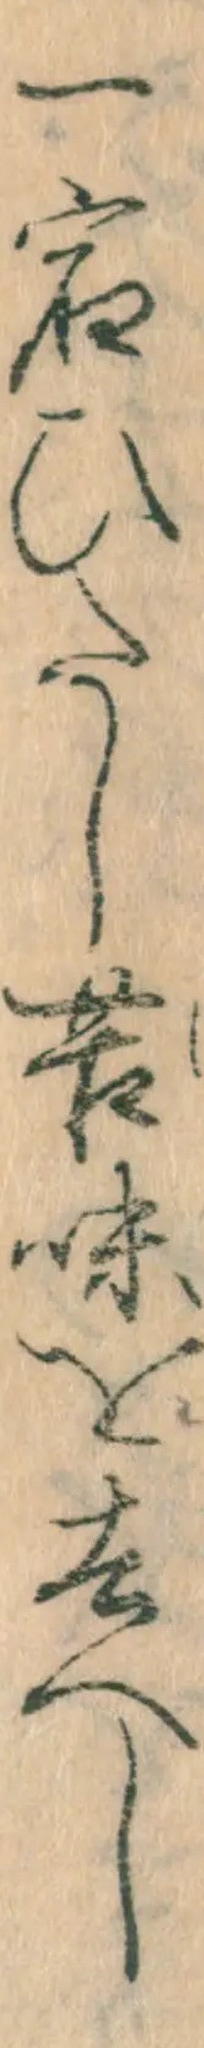一宿ひたし苦味を去へし
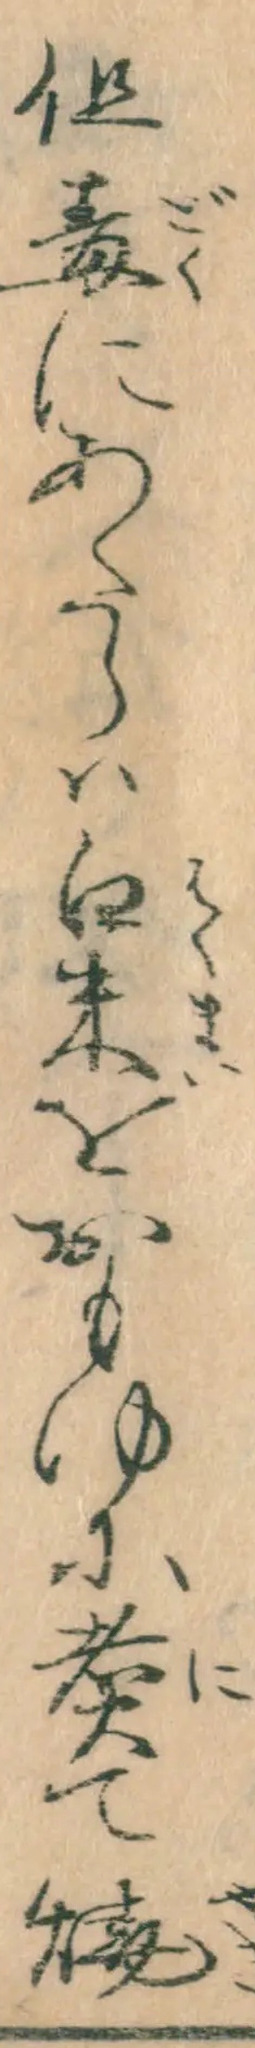但毒にあたらは白米をおもゆに煮て焼

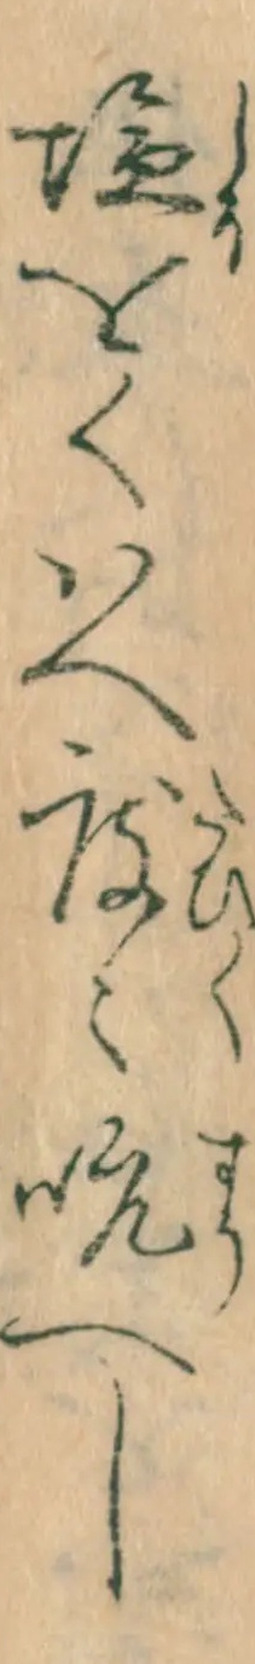塩をくはへ度々吮へし
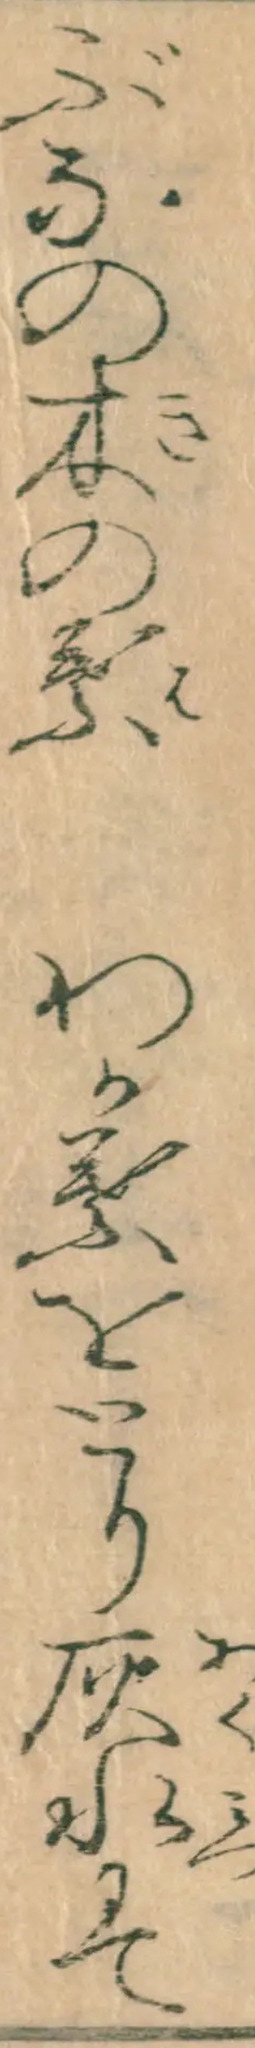ぶなの木の葉わか葉をとり灰水にて
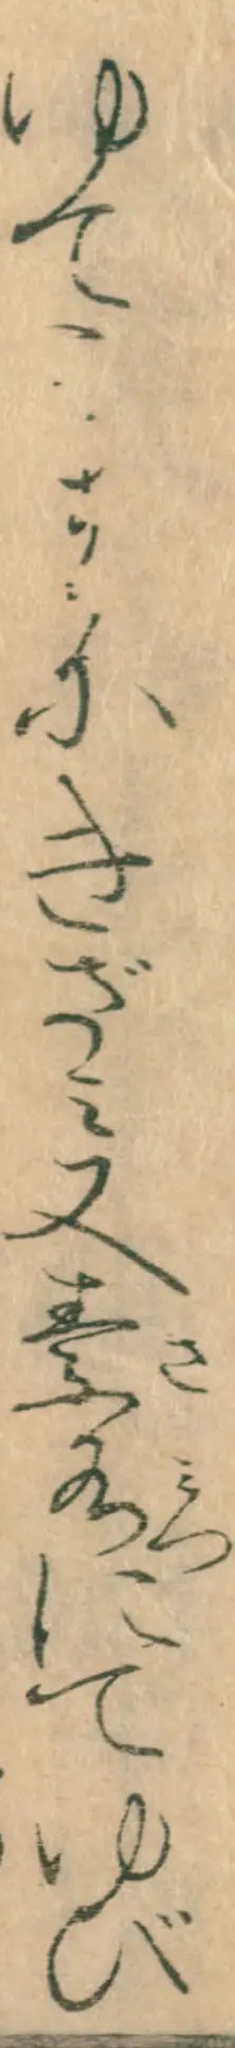ゆてこまかにきざみ又素水にてゆび
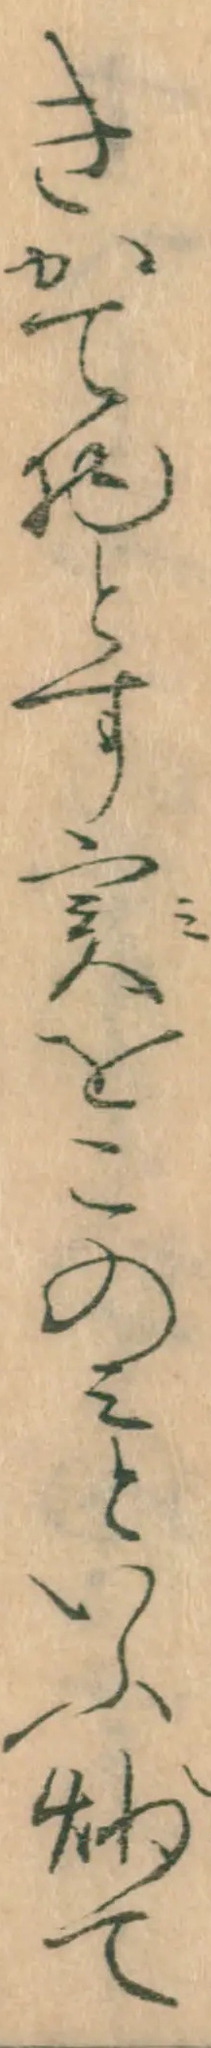きかて物とす実をこのみといふ炒て
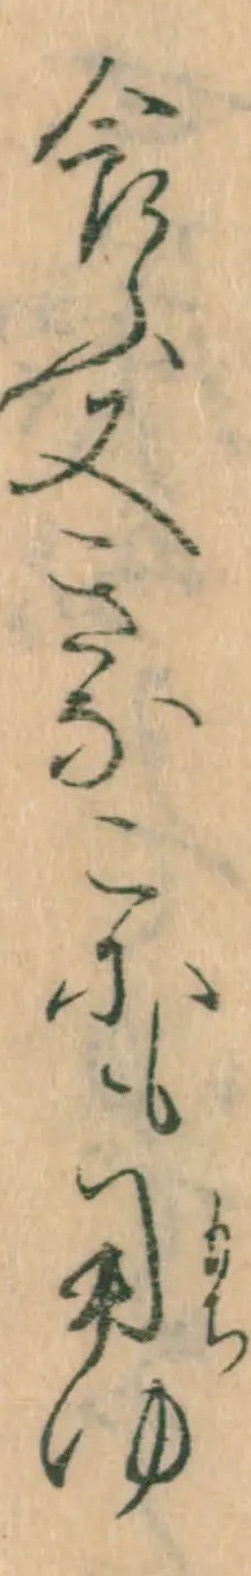食ふ又きなこにも用ゆ
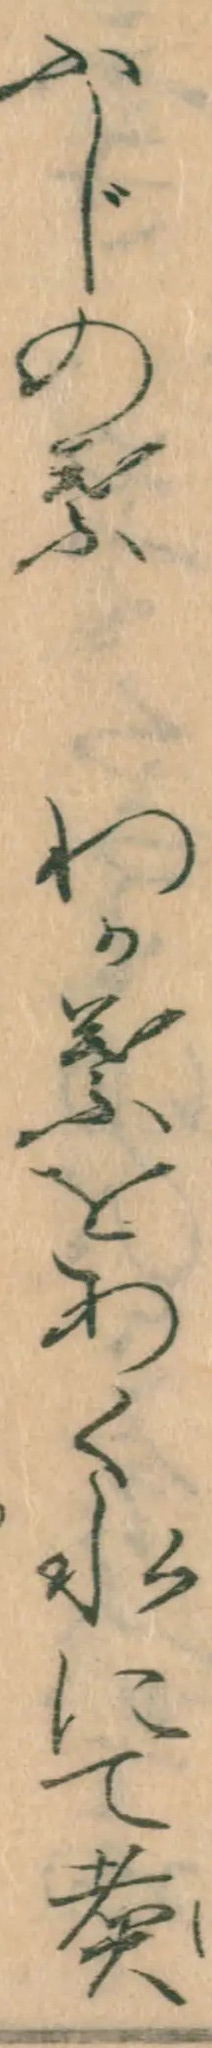ふじの葉わか葉をあく水にて煮
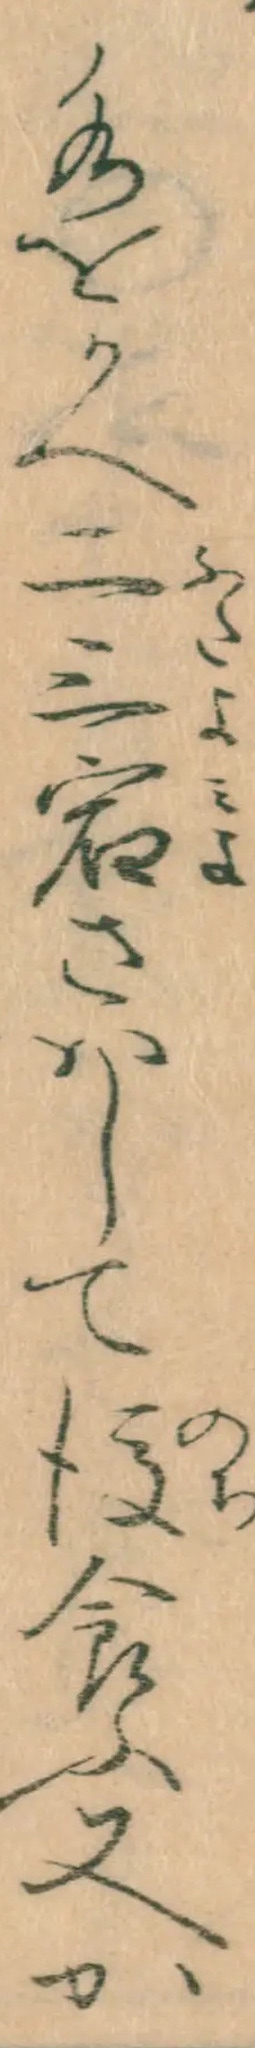水をかへ二三宿さはして後食ふ又か
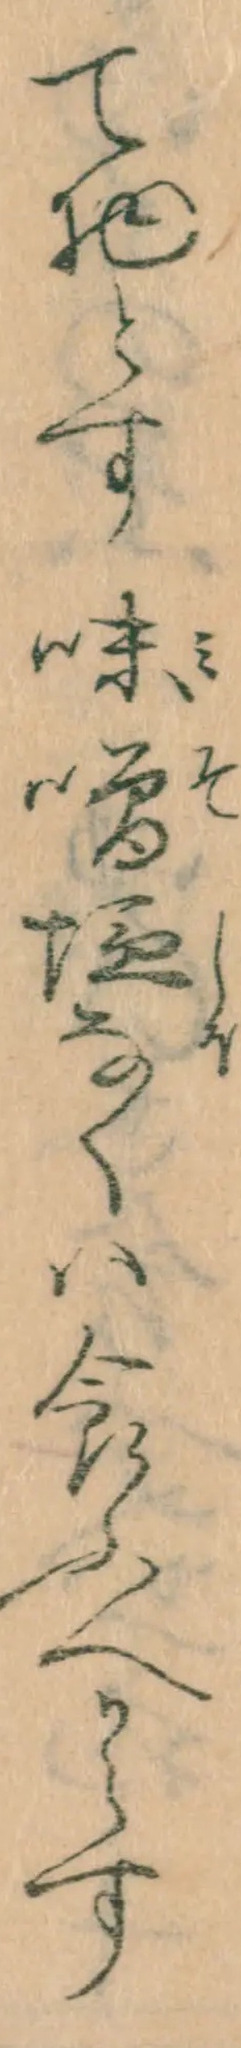て物とす味噌塩なくは食ふへからす
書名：かてもの
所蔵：国立国会図書館 National Diet Library, JAPAN
